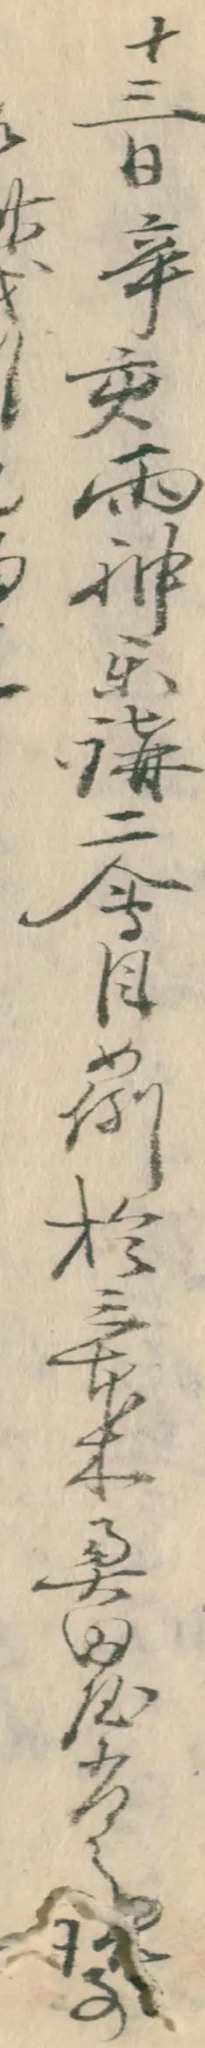十三日辛亥雨神楽講二會目如例於三本木奥田屋有之事
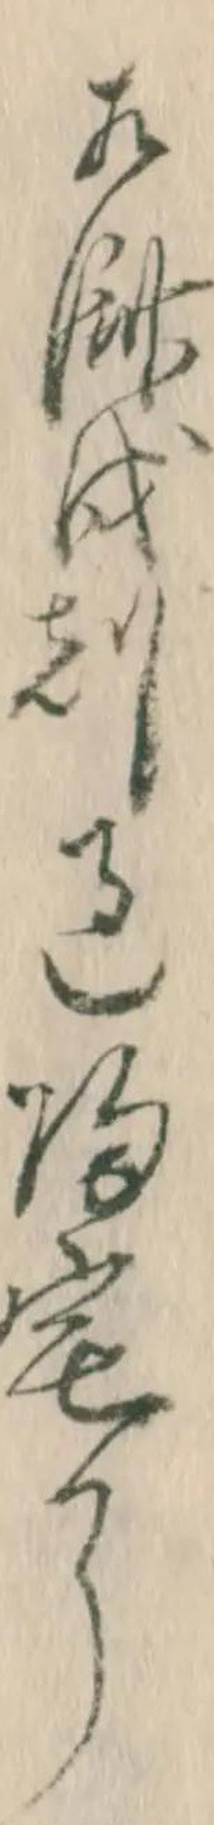相済戌刻過帰宅了
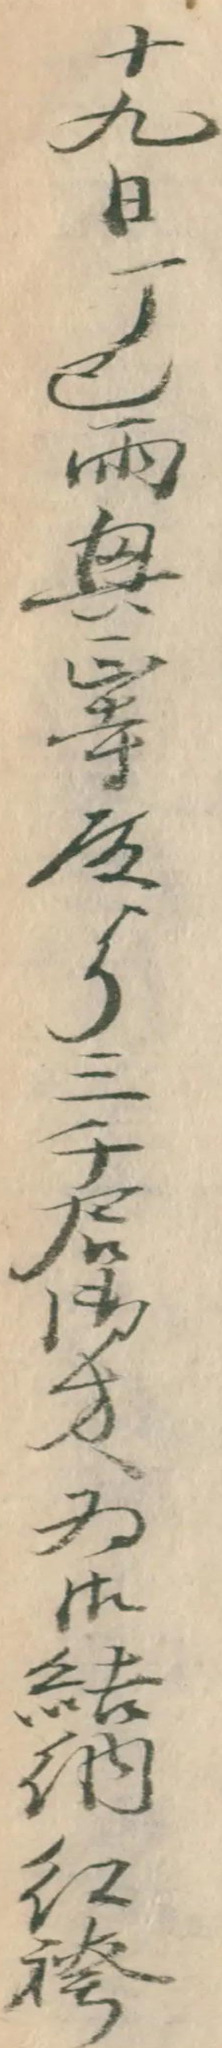十九日丁巳雨興正寺殿より三千居御方へ為御結納紅袴

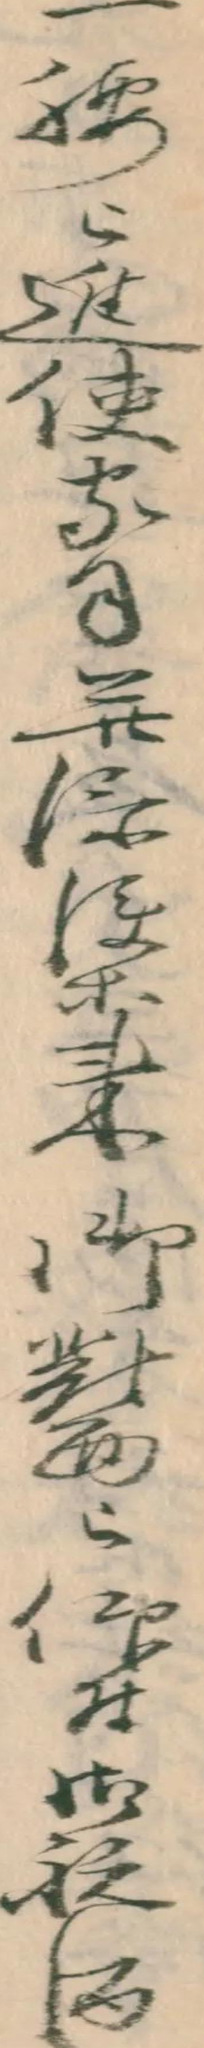一被進使家司幷添等来御對面被仰付御祝酒
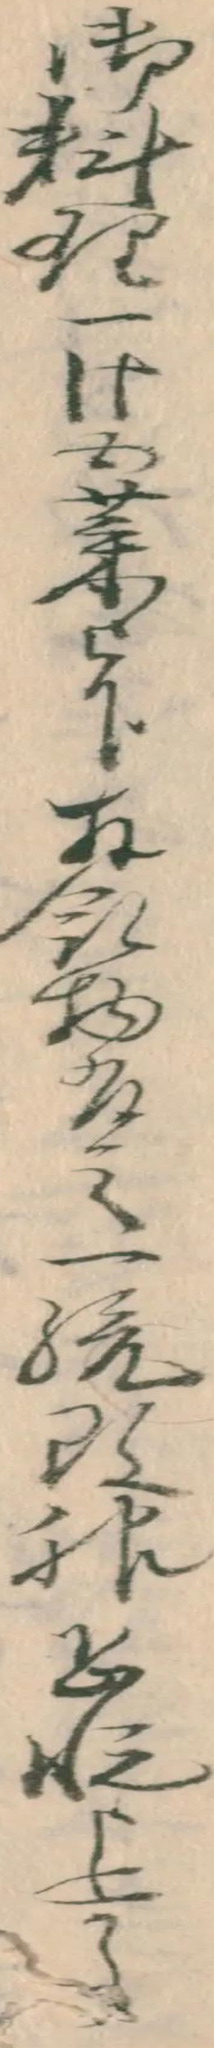御料理一汁五菜被下相領物有之一統改服恐悦申上了
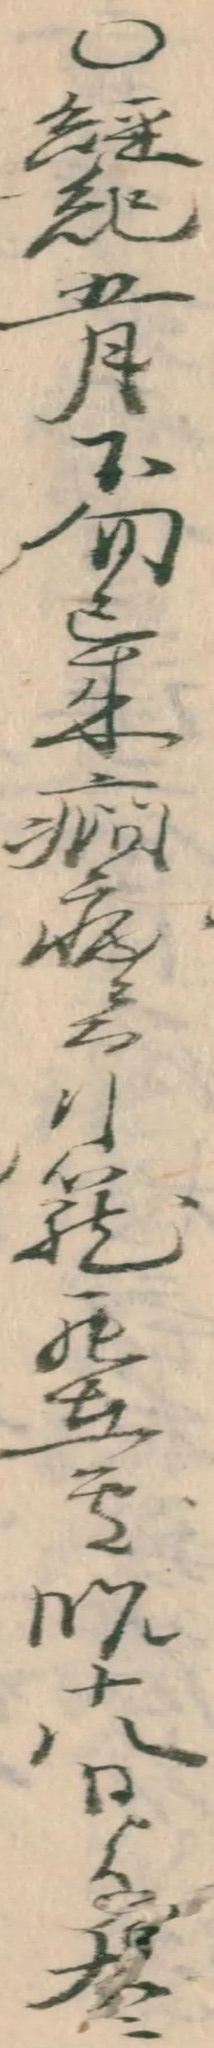○経紀五月下旬已来癇症ニ而引籠罷在處昨十八日ゟハ大ニ
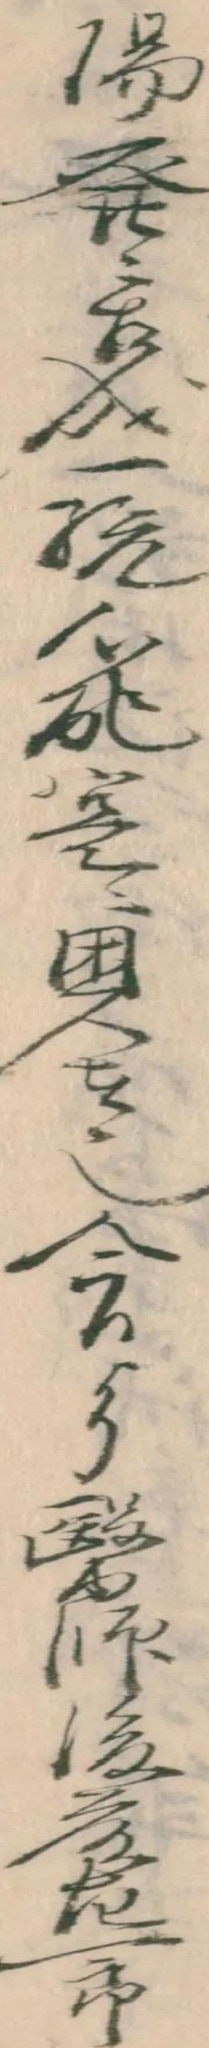陽発ニ相成一統心配候是ニ困人者也今日より醫師後藤左一郎
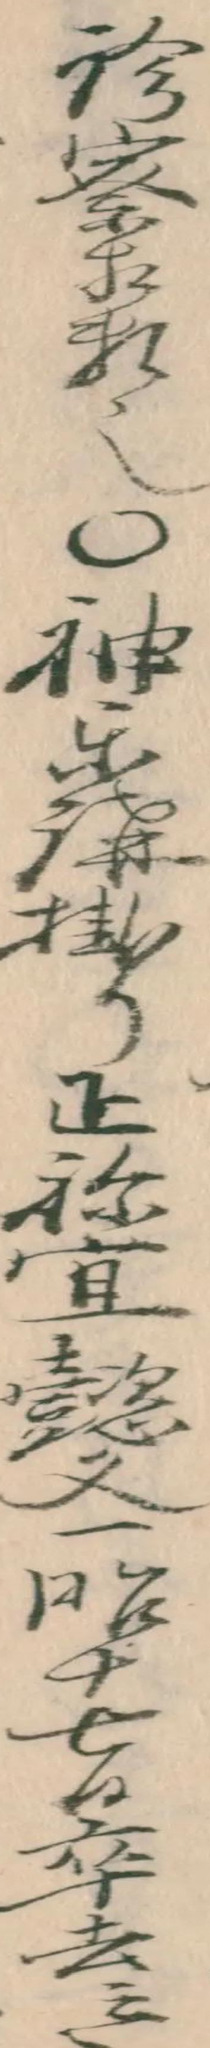診察相頼也○神楽構掛り正称宜懿久一昨十七日卒去云〻
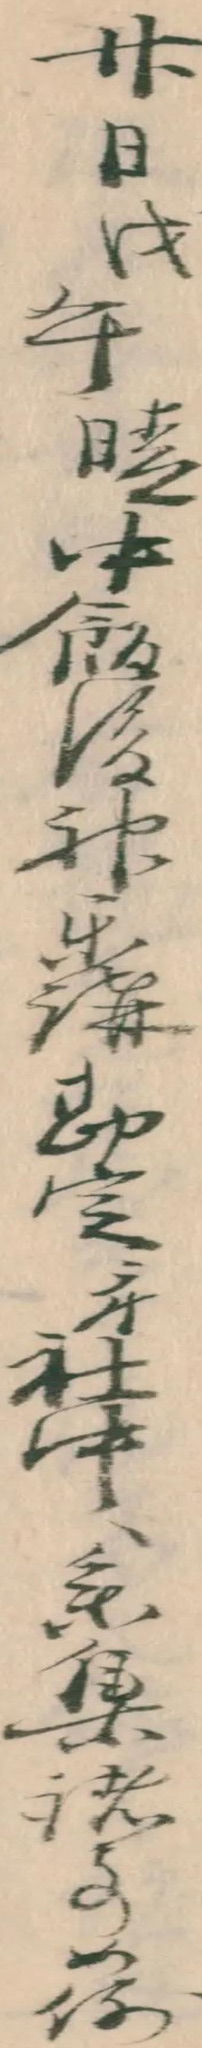廿日戊午晴中飯後神楽講勘定ニ付社中へ参集諸事如例
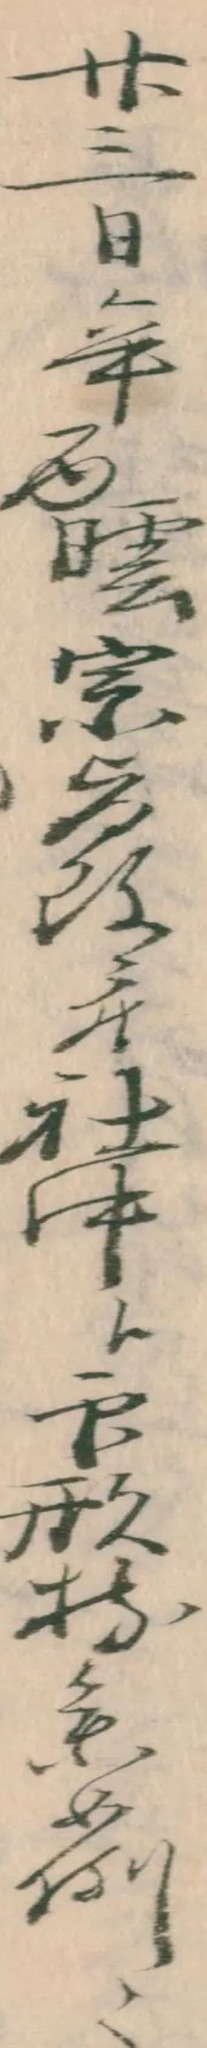廿三日辛酉曇宗旨改ニ付社中え印形持参如例也
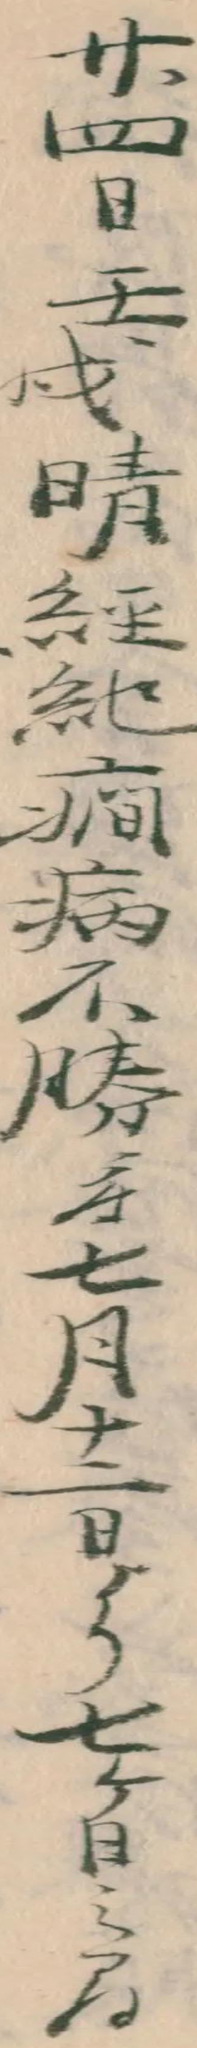廿四日壬戌晴経紀癇病不勝ニ付七月十二日より七ケ日之間
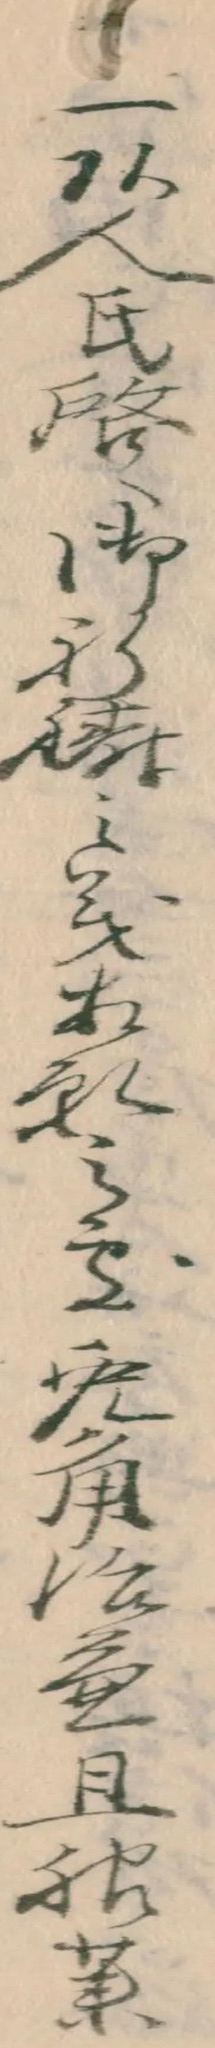一頭人氏啓へ御祈祷之義相願之處兎角治益且服薬
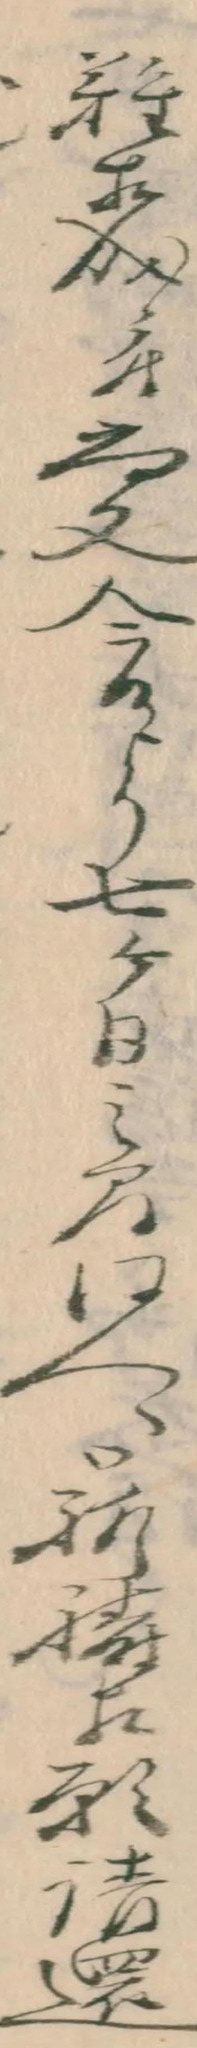難相成ニ付尚又今日より七ヶ月之間同人へ御祈祷相願請還
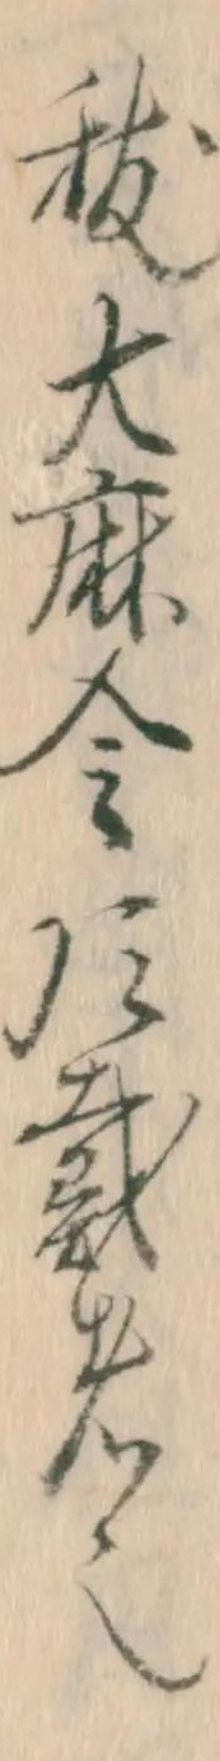祓大麻令頂戴者也
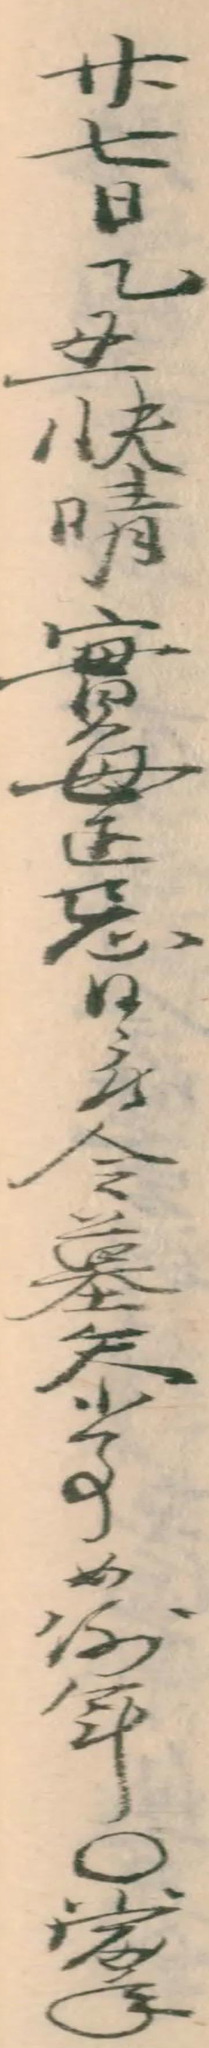廿七日乙丑快晴實母正忌日ニ付令墓参事如例年〇當年
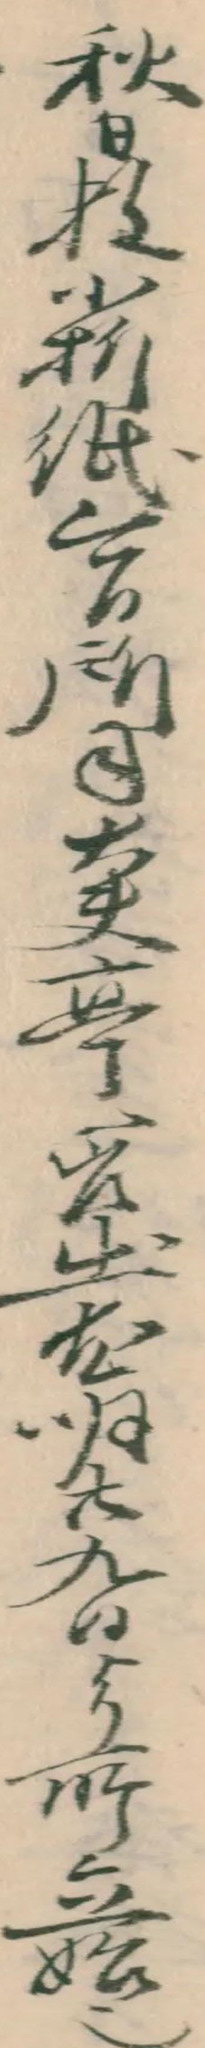秋日数小折紙今日所司大夫亭へ差出尤明廿九日より所立始也
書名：賀茂社記録. 第66冊
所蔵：国立国会図書館 National Diet Library, JAPAN
